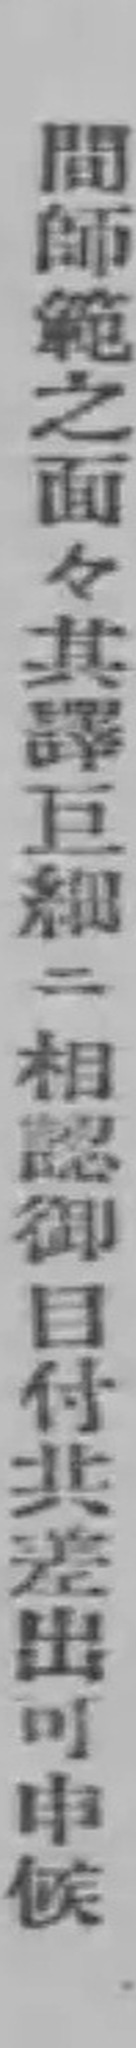間師範之面々其訳巨細ニ相認御目付其差出可申候
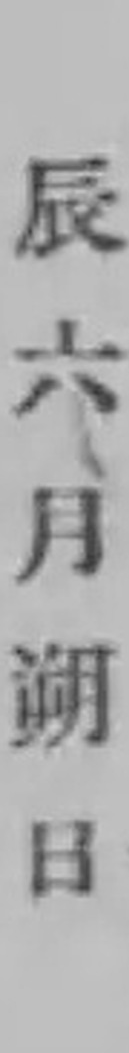辰六月朔日
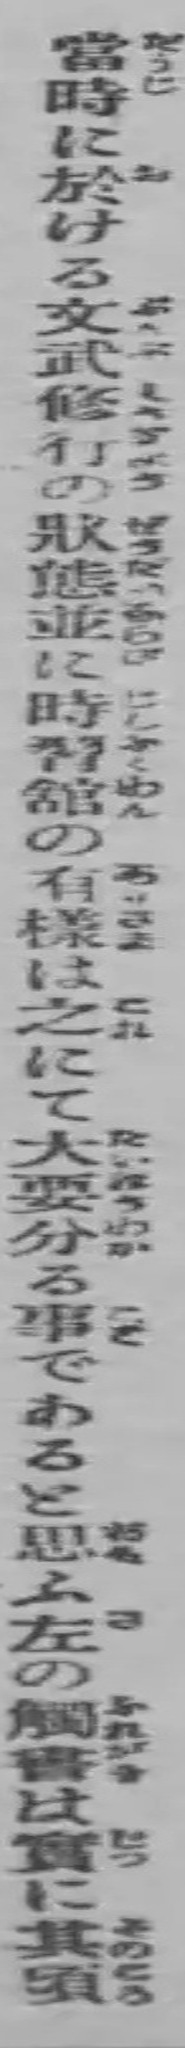当時に於ける文武修行の状態並に時習館の有様は之にて大要分る事であると思ふ左の触書は実に其頃
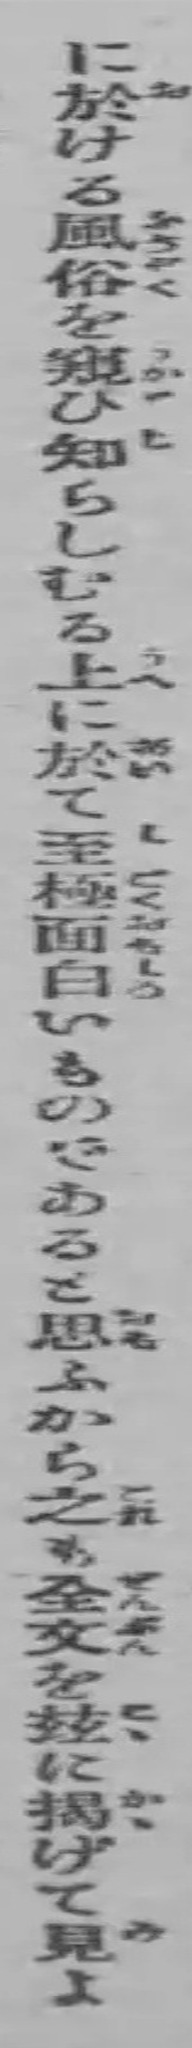に於ける風俗を窺ひ知らしむる上に於て至極面白いものであると思ふから之も全文を茲に掲げて見よ
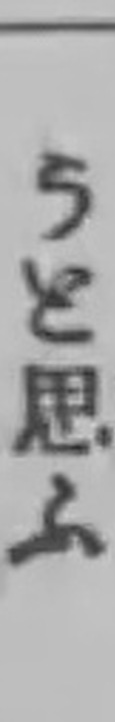うと思ふ
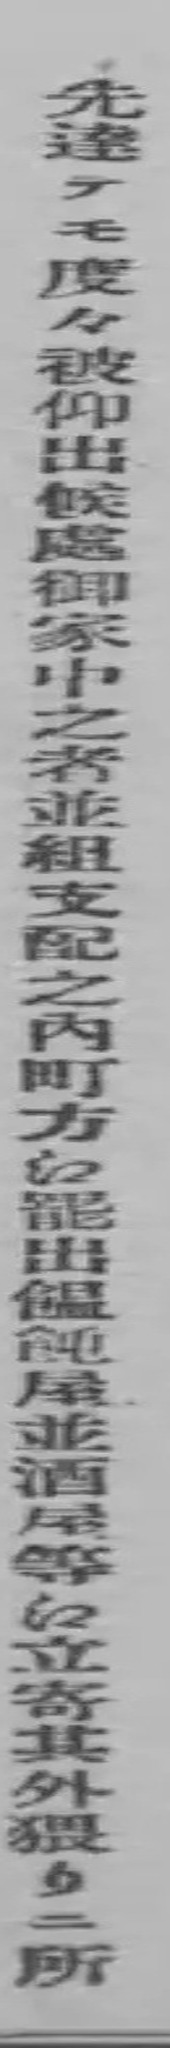先達テモ度々被仰出候処御家中之者並組支配之内町方え罷出饂飩屋並酒屋等え立寄其外猥りニ所
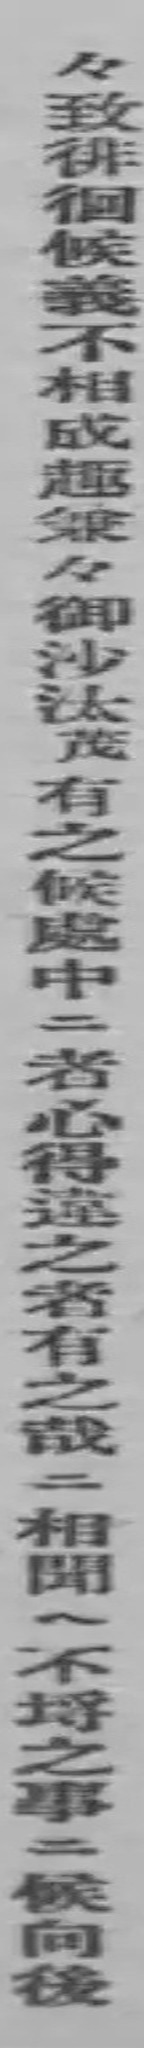々致徘徊候義不相成趣兼々御沙汰茂有之候処中ニ者心得違之者有之哉ニ相聞へ不埒之事ニ候向後
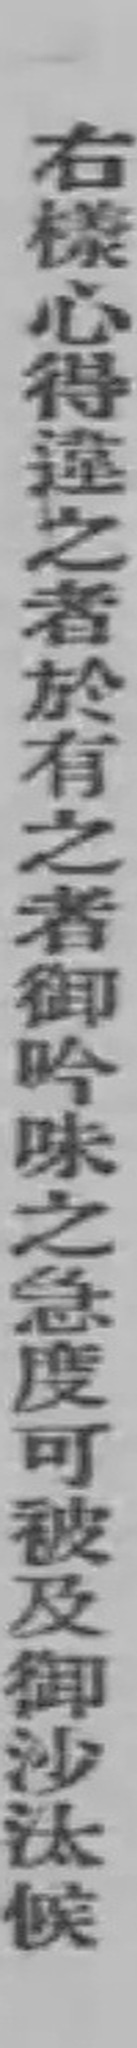右様心得違之者於有之者御吟味之急度可被及御沙汰候
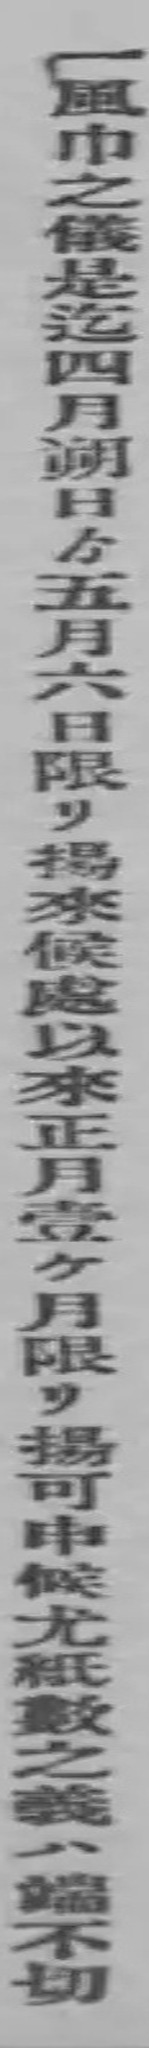一風巾之儀是迄四月朔日ゟ五月六日限リ揚来候処以来正月壱ケ月限リ揚可申候尤紙数之義ハ端不切
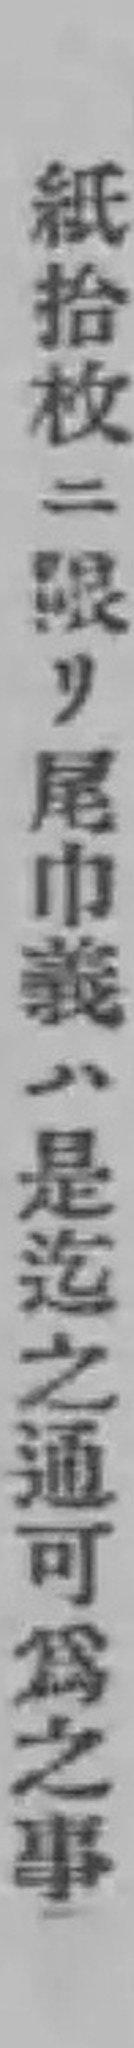紙拾枚ニ限リ尾巾義ハ是迄之通可為之事
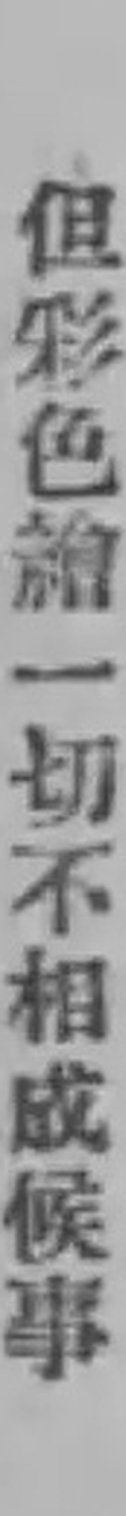但彩色絵一切不相成候事

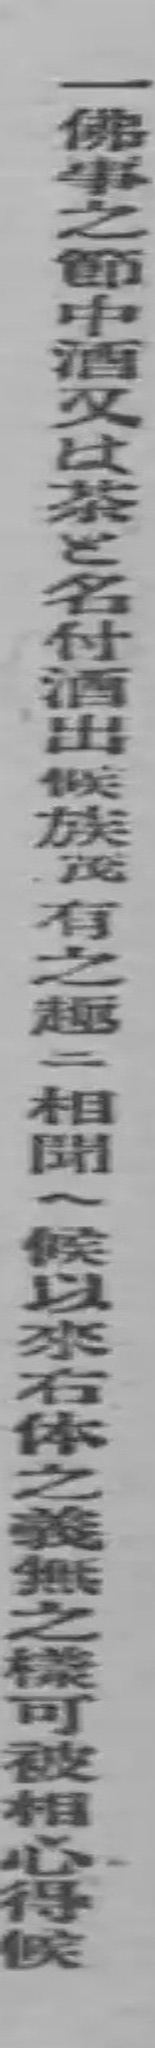一仏事之節中酒又は茶と名付酒出候族茂有之趣ニ相聞ヘ候以来右体之義無之様可被相心得候
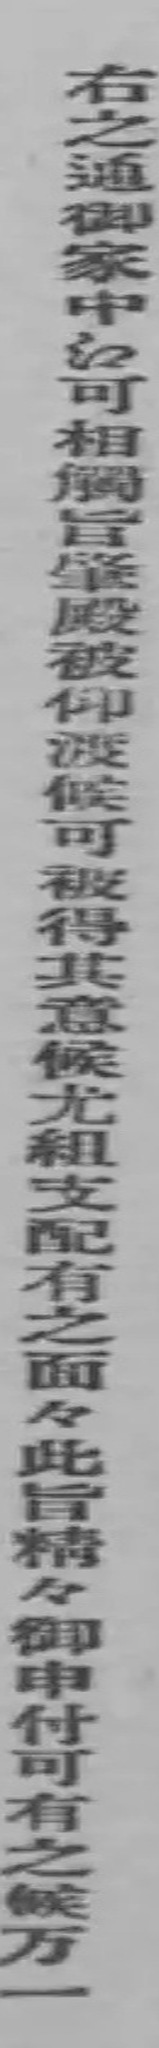右之通御家中え可相觸旨肇殿被仰渡候可被得其意候尤組支配有之面々此旨精々御申付可有之候万一
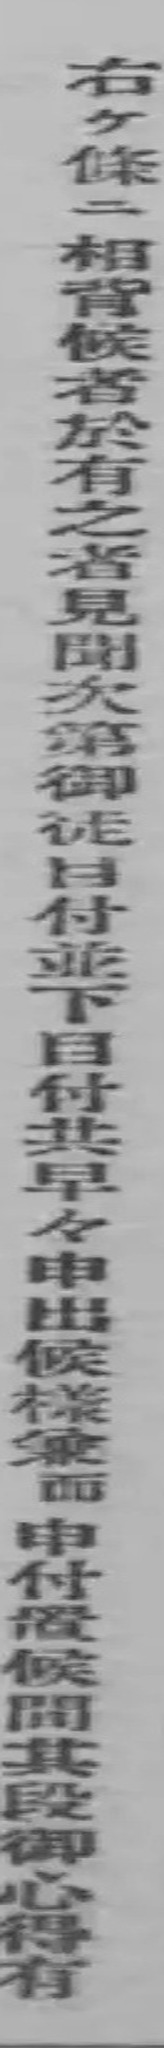右ケ條ニ相背候者於有之者見聞次第御徒目付並下目付共早々申出候様兼而申付置候間其段御心得有
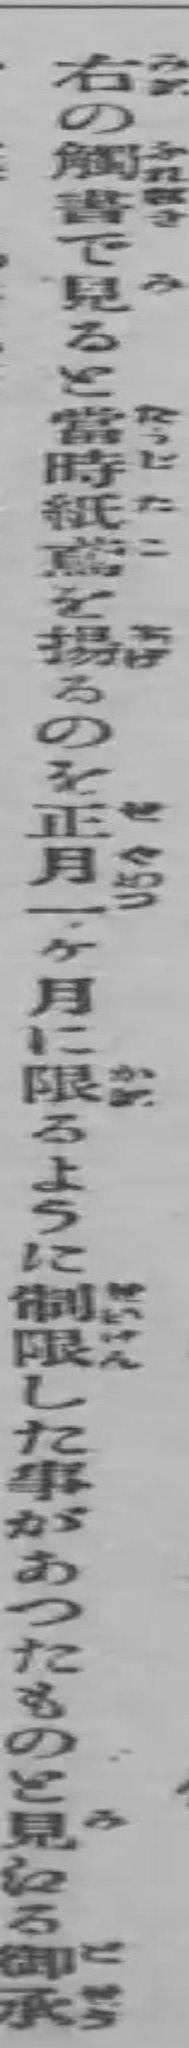右の触書で見ると当時紙鳶を揚るのを正月一ケ月に限るように制限した事があつたものと見える御承
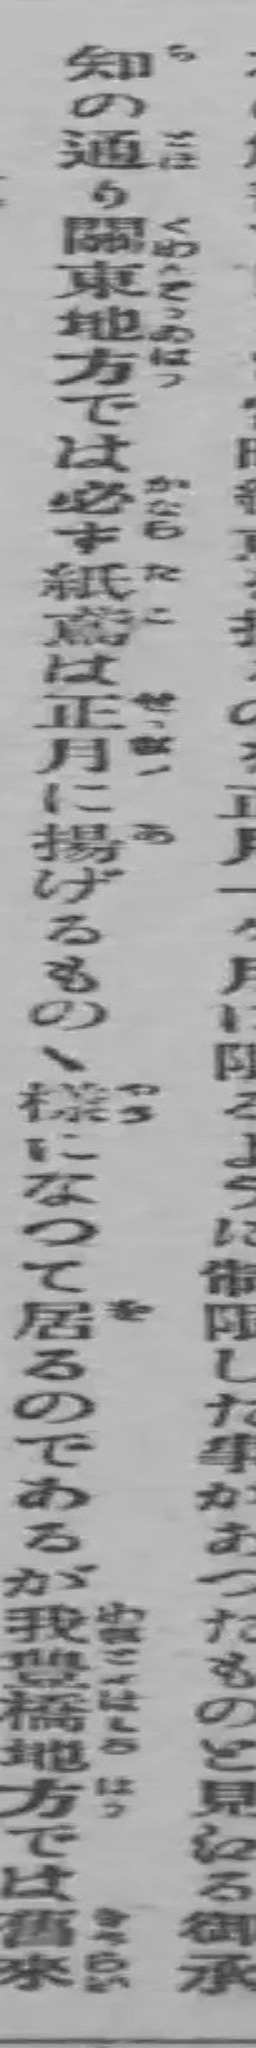知の通り関東地方では必ず紙鳶は正月に揚げるものゝ様になつて居るのであるが我豊橋地方では旧来
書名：豊橋市史談
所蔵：国立国会図書館 National Diet Library, JAPAN
